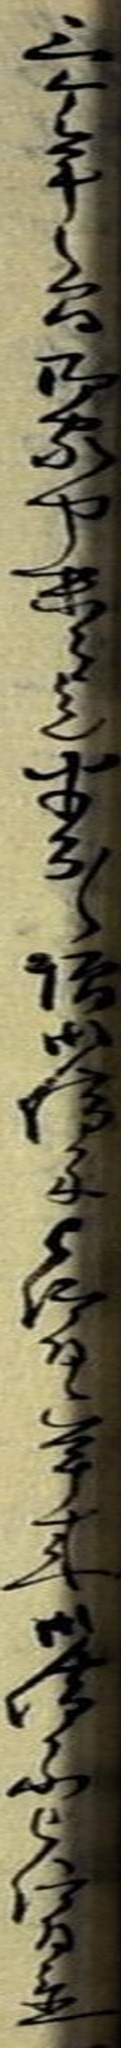三ヶ年之間御家中末々迄半分之増借米被仰付候年来御借米被仰付置一統
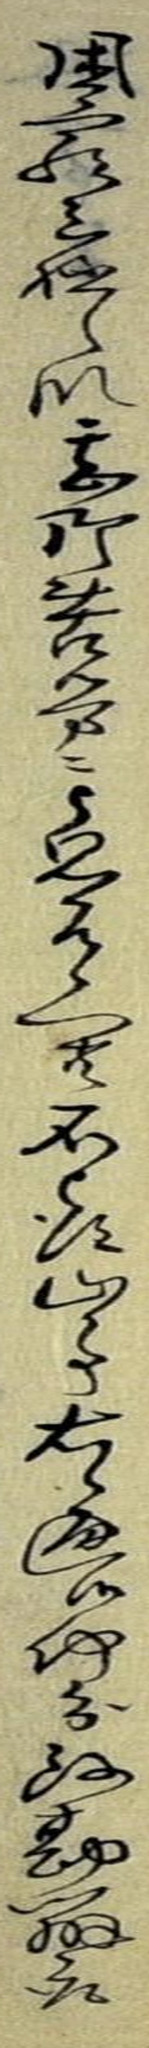困窮至極之段甚御苦労に被思召候へ共不被得止事右之通候何分致勘弁取
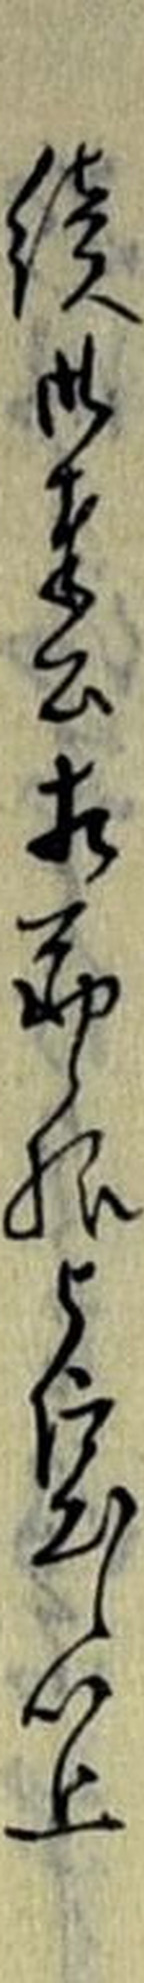続御奉公相勤候様被仰出候以上
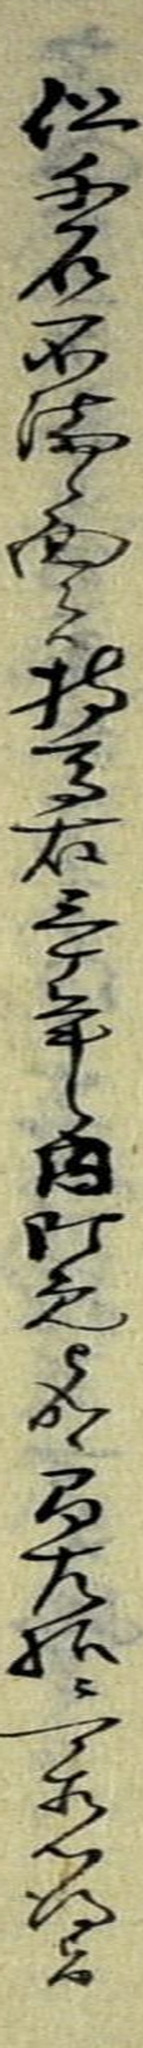但千石不満之面々は持馬右三ヶ年之内御免被成候間左様に可相心得旨
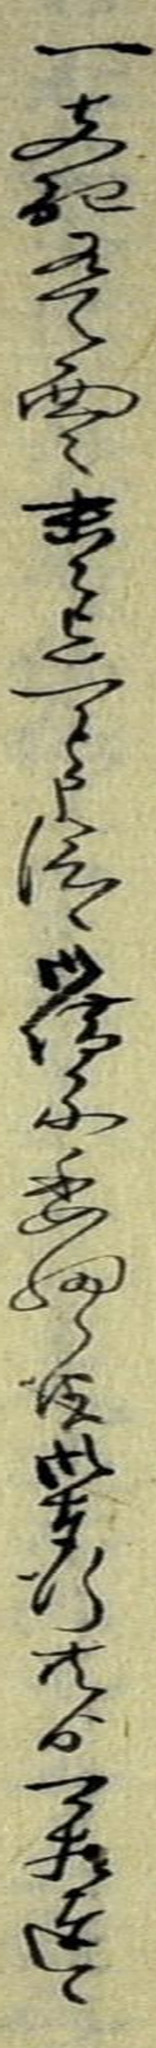一支配有之面々末々迄可被申渡候御借米委細之儀は御奉行共ゟ可相達候
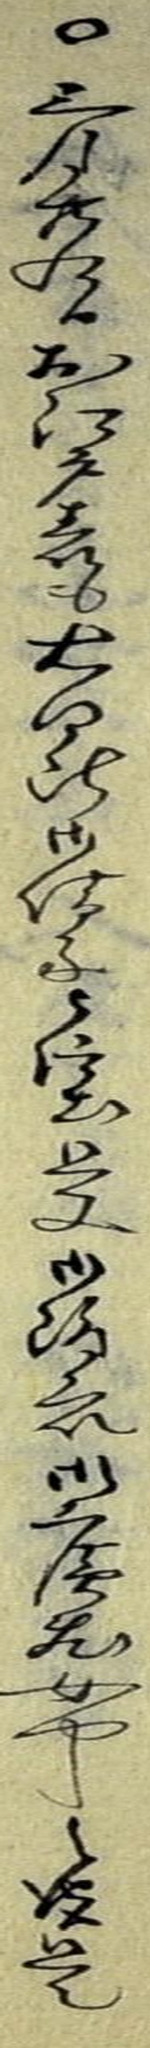〇三月廿九日於江戸表も右同断御借米被仰出且又御附衆御広敷女中之儀は是
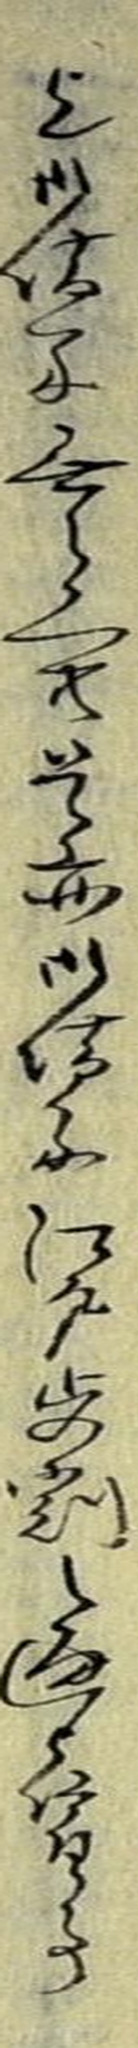迄御借米無之候へ共是亦御借米江戸歩割之通被仰付候事
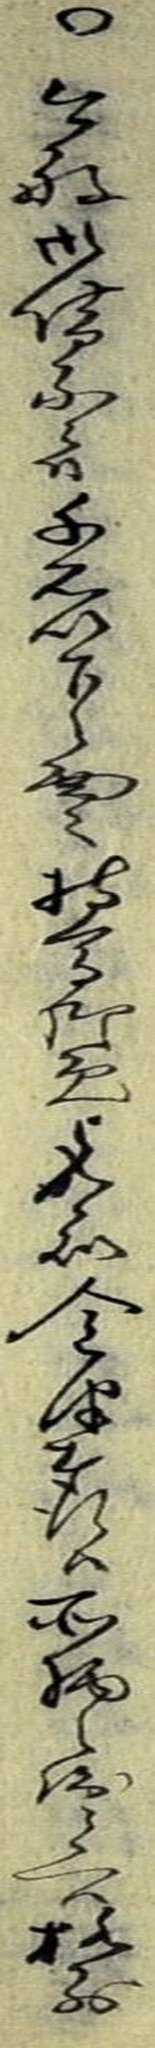〇今般御借米に付千石以下之面々持馬御免被成候処金津奉行は所柄之儀に候へは格別
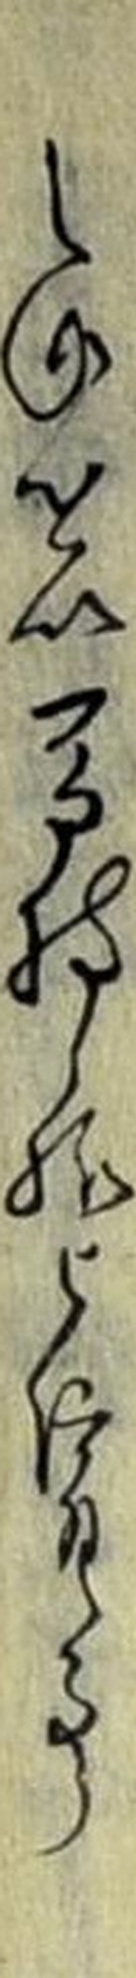之趣を以馬持候様被仰付候事
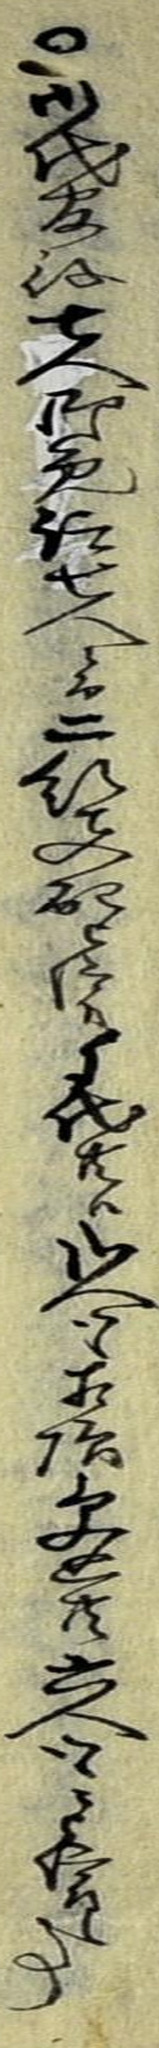〇御代官役七人御免跡七人に而二領支配被仰付手代共は弐人ツヽ相増受込共六人ツヽに被仰付候事
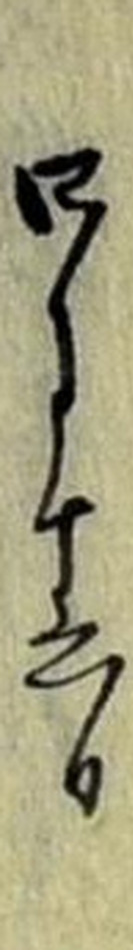四月十六日
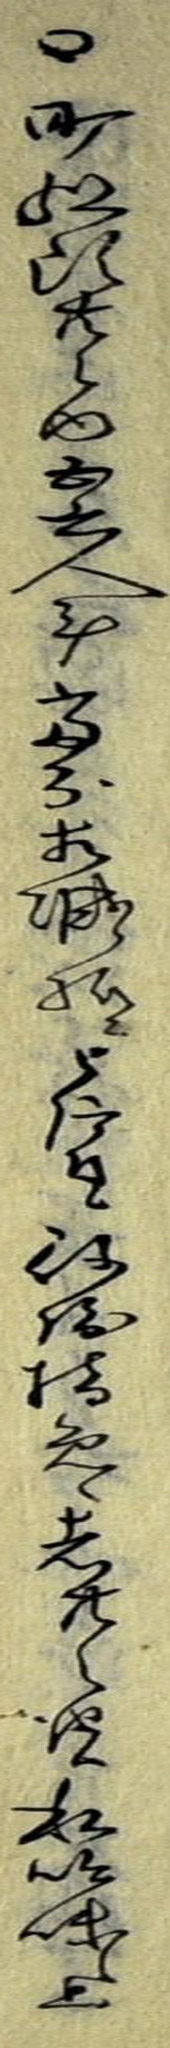〇町組頭共之内五六人斗当分相減候様に被仰付候役儀指免候者共之儀は私吟味候上

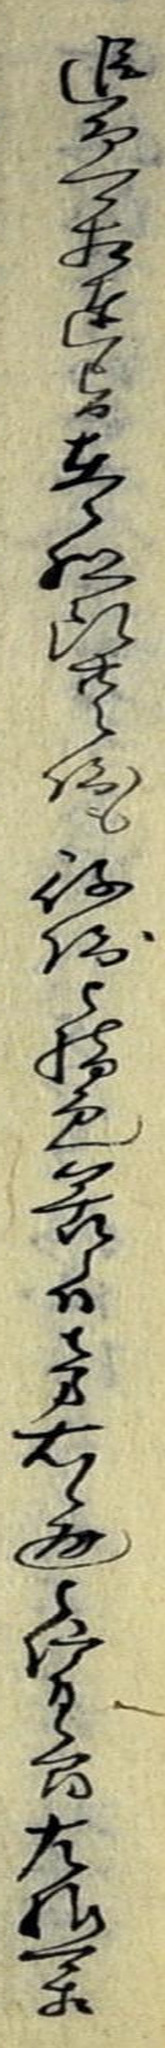追而可相達旨在々組頭共之儀も役儀被指免筈に付旁右之通被仰付候間左様可相
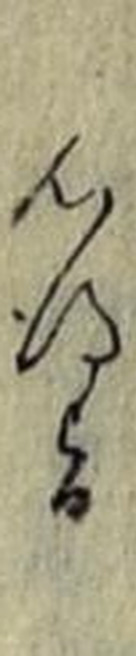心得旨
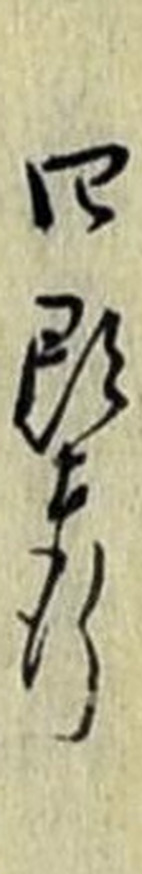四郡奉行
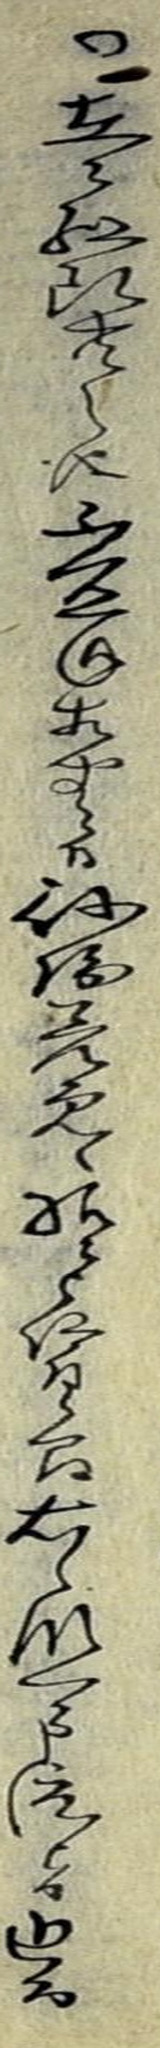〇在々組頭共之儀不宜趣相聞候に付役儀差免候様に被仰付候間右之段可申渡旨追而
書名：命令之部 二
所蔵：福井県文書館 Fukui Prefectural Archives
